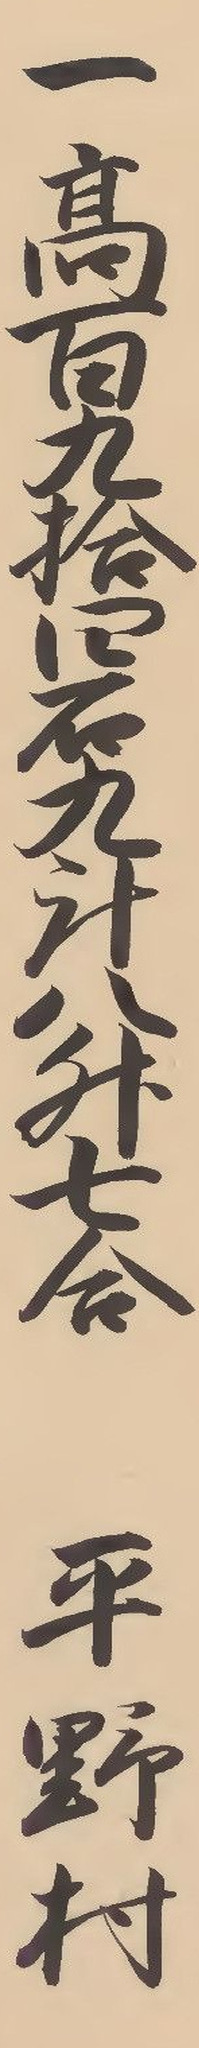一高百九拾四石九斗八升七合平野村
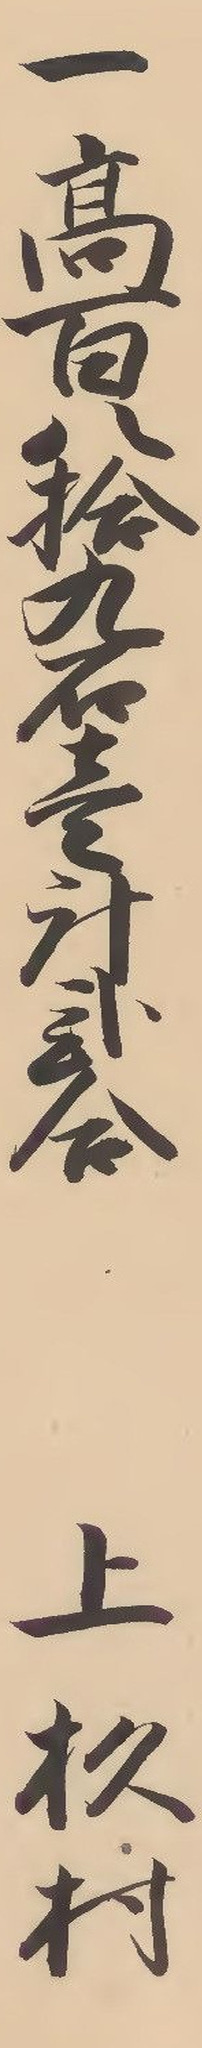一高百八拾九石壱斗弐合上杉村

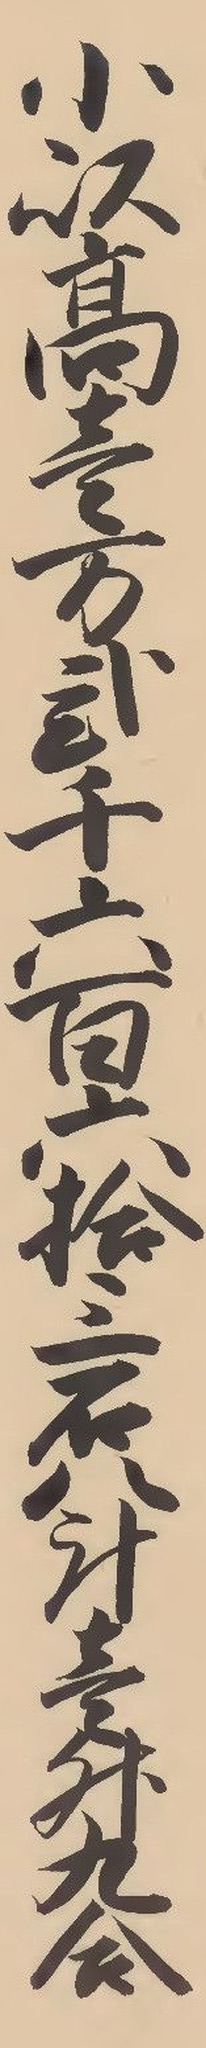小以高壱万弐千六百六拾三石八斗壱升九合
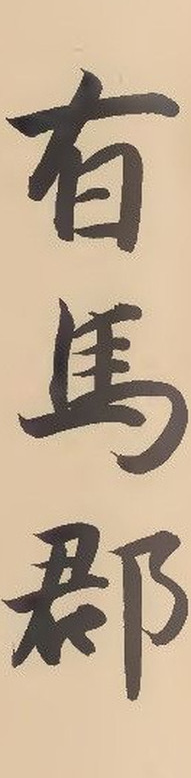有馬郡
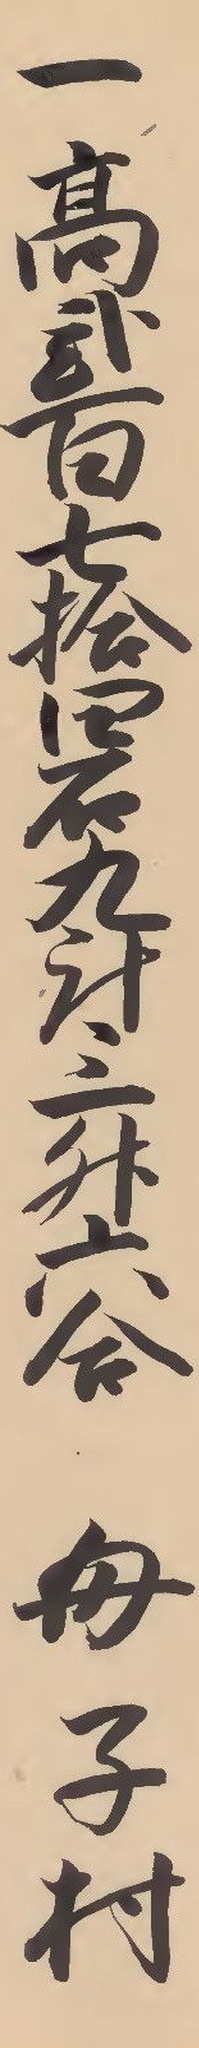一高弐百七拾四石九斗三升六合母子村
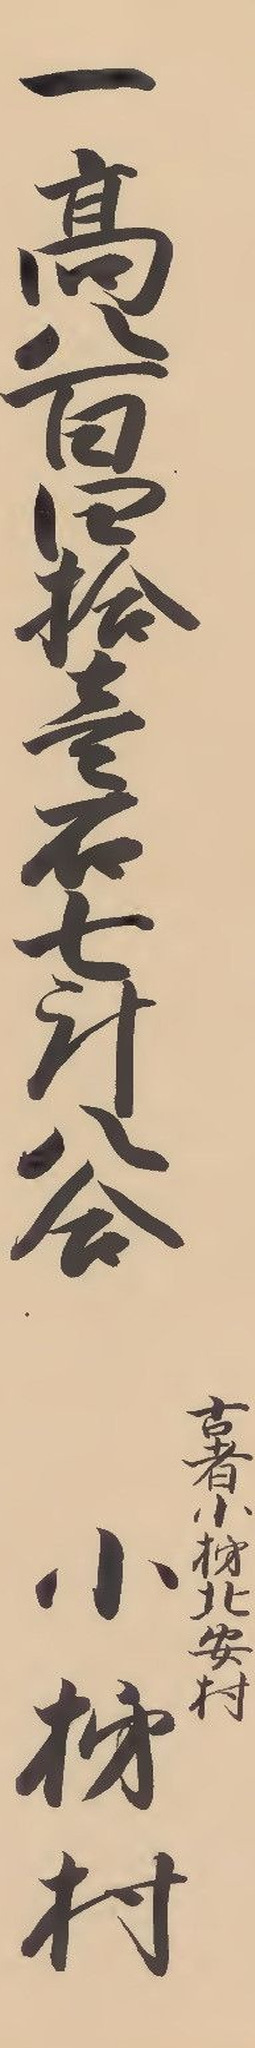一高八百四拾壱石七斗八合小柿村
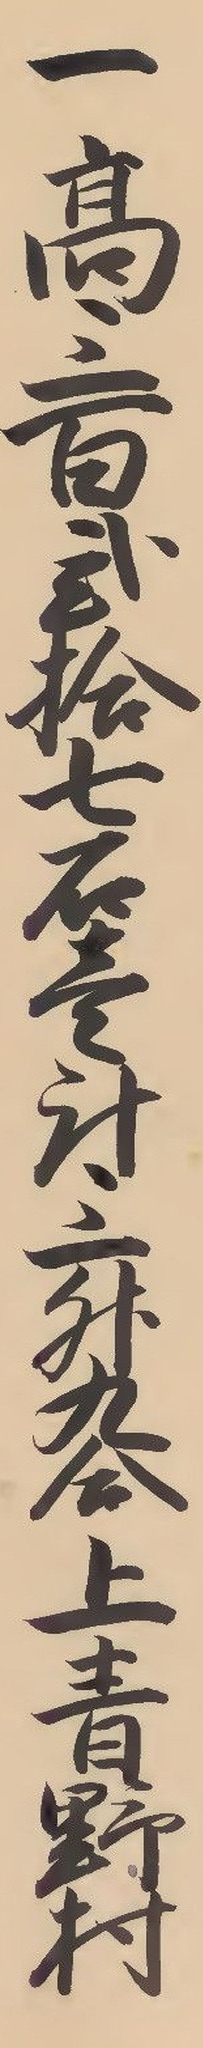一高三百弐拾七石壱斗三外升九合上青野村

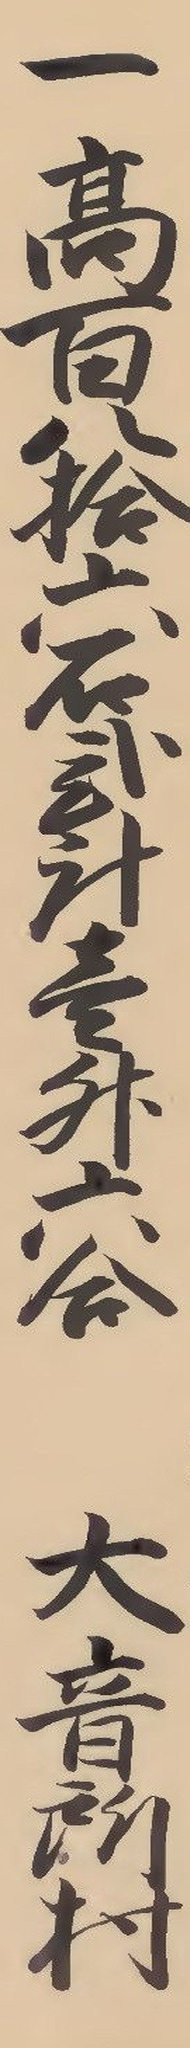一高百八拾六石弐斗壱升六合大音所村
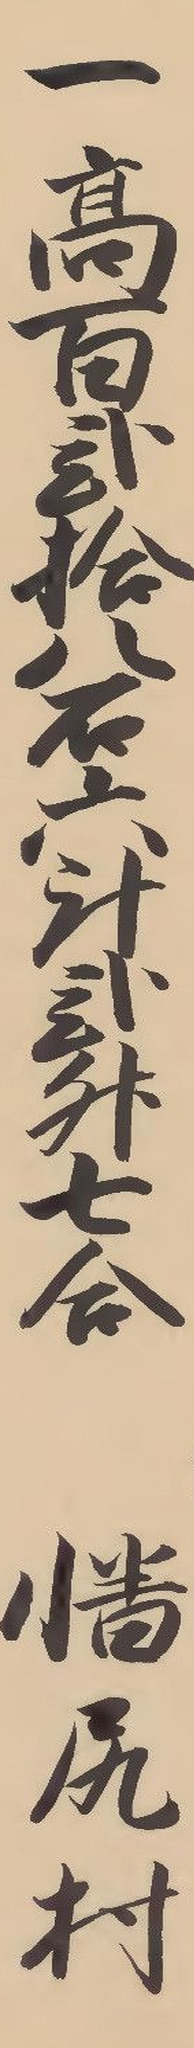一高百弐拾八石六斗弐升七合幡尻村
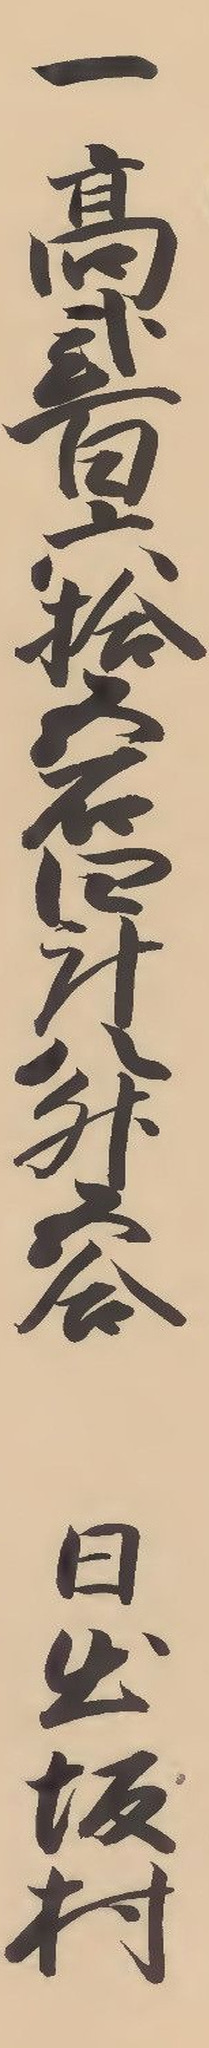一高弐百六拾五石四斗八升五合日出坂村
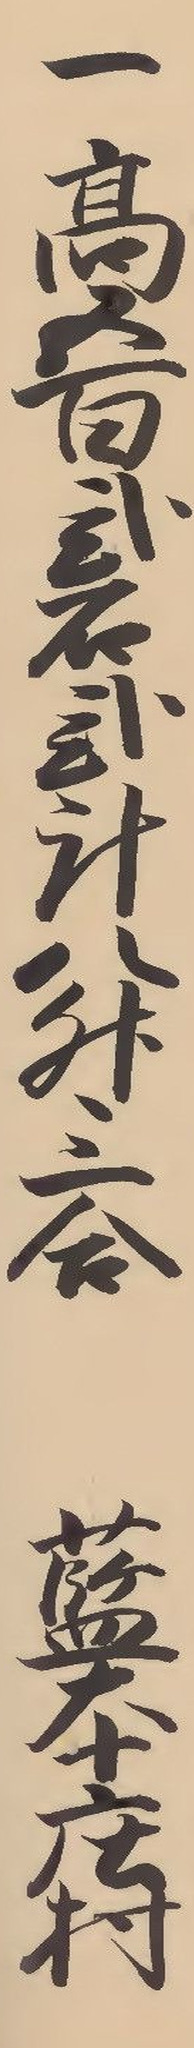一高五百弐石弐斗八升三合藍本庄村
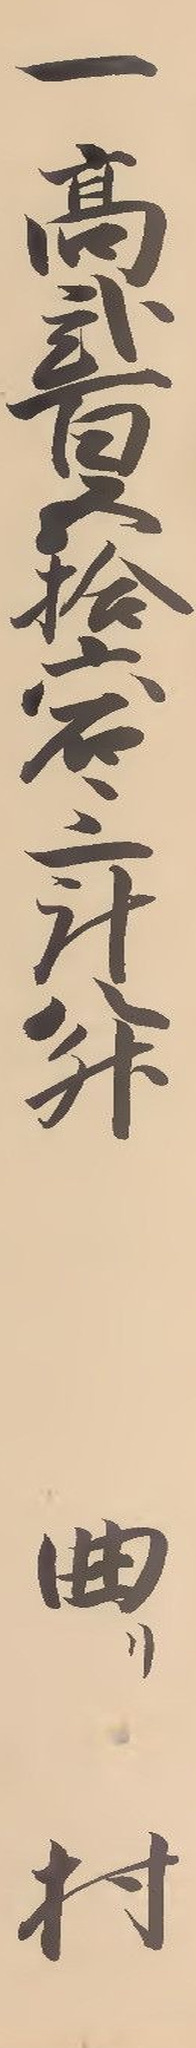一高弐百五拾六石三斗八升曲り村
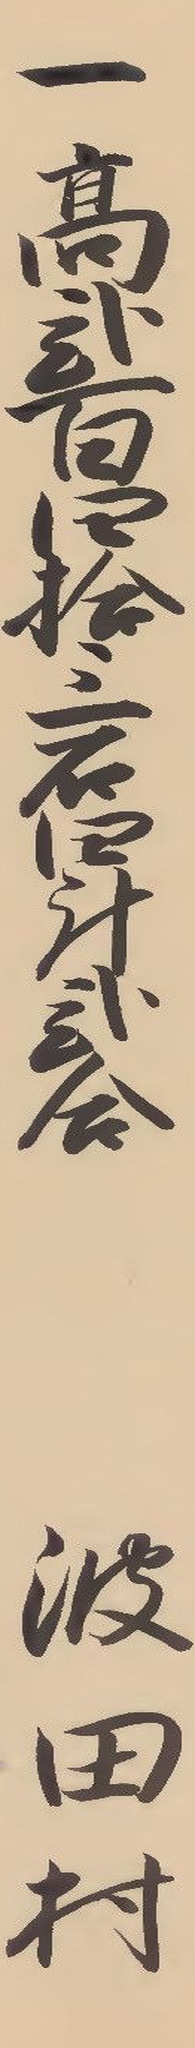一高弐百四拾三石四斗弐合波田村
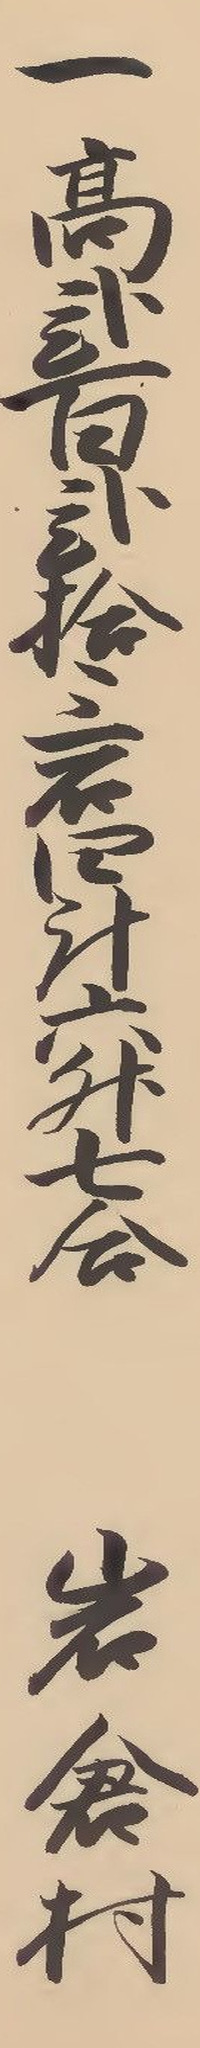一高弐百弐拾三石四斗六升七合岩倉村
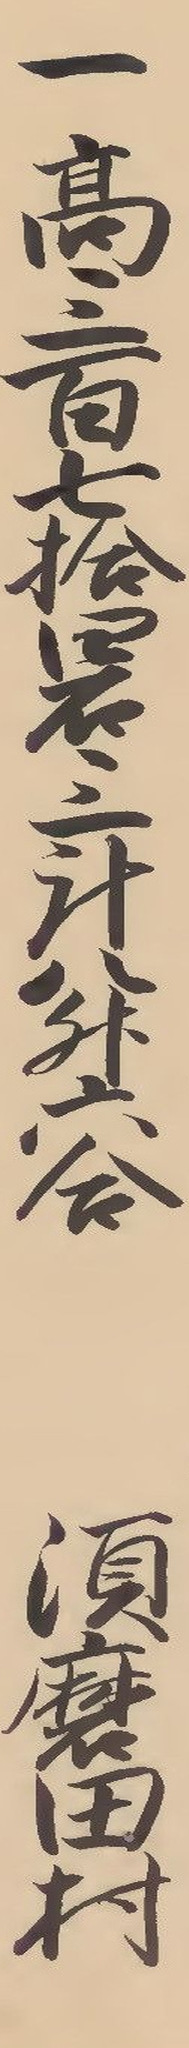一高三百七拾四石三斗八升六合須磨田村

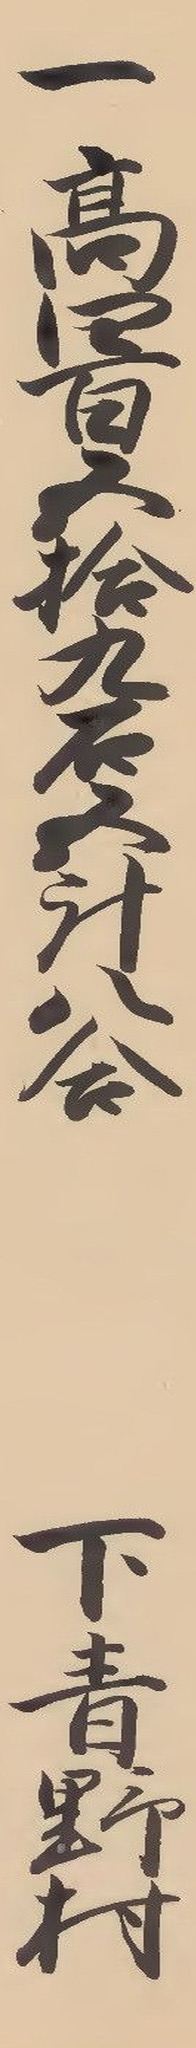一高四百五拾九石五斗八合下青野村
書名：摂津国郷帳
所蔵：国立公文書館 National Archives of Japan
